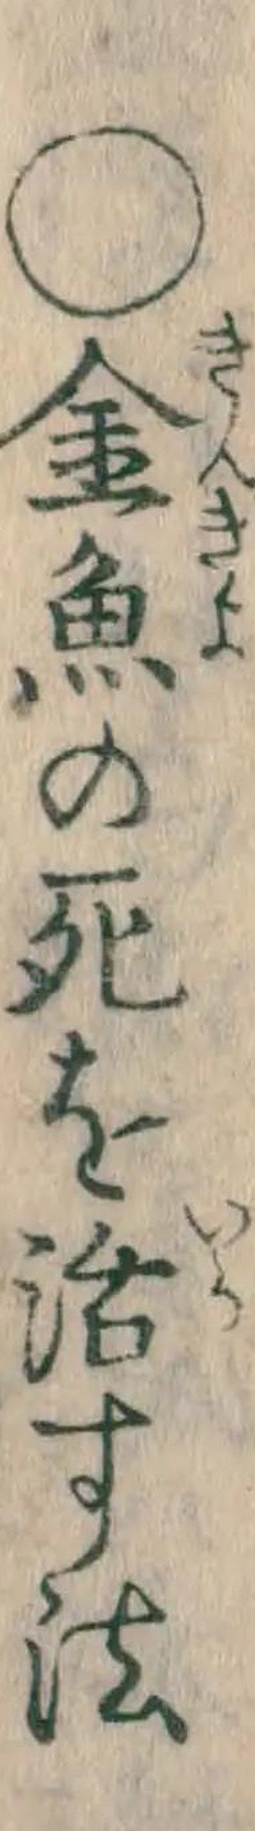○金魚の死を活す法
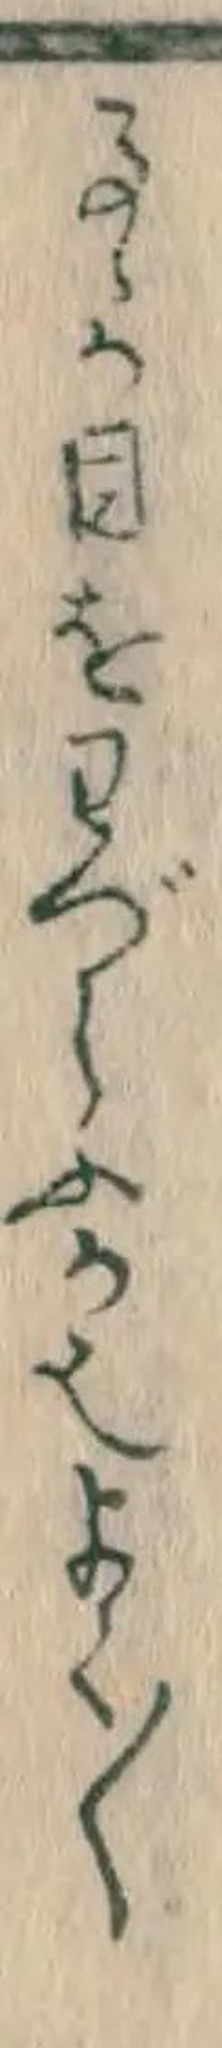るゝか目をわづらふか也よく〳〵
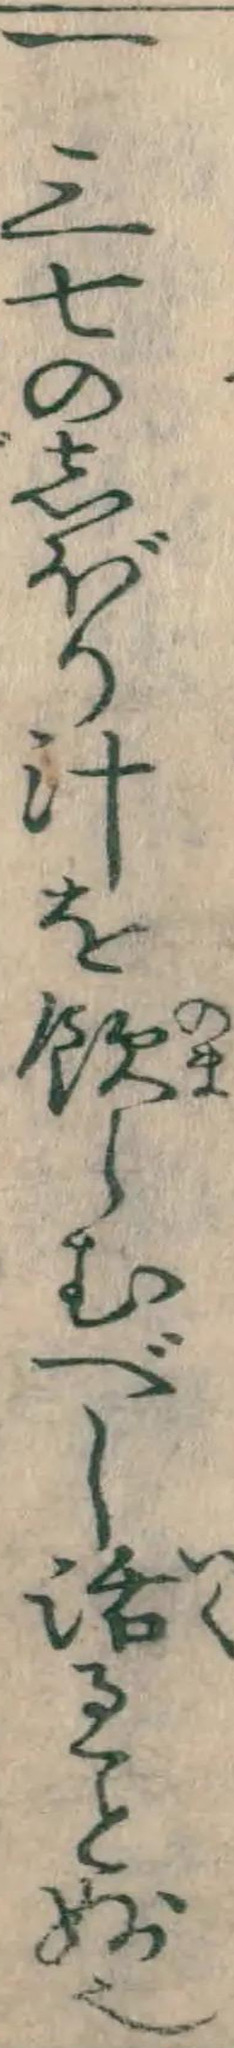一三七のしぼり汁を飲しむべし活ること妙也
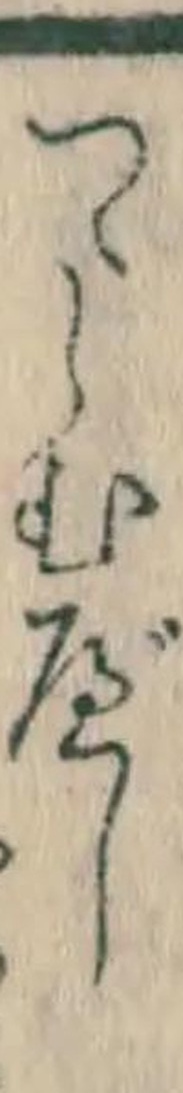つゝしむべし
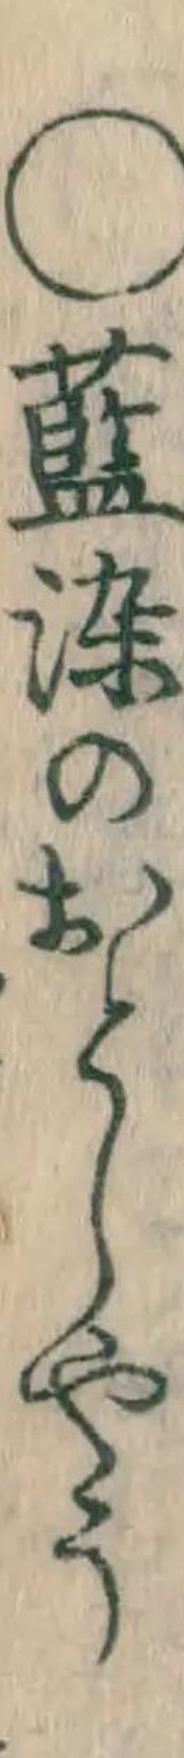○藍染のおとしやう
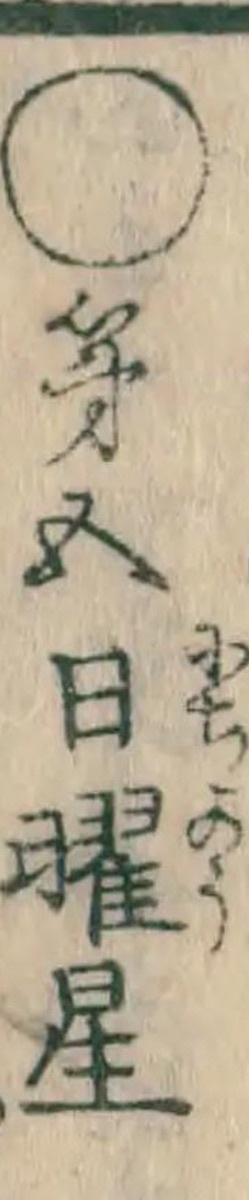〇第五日曜星
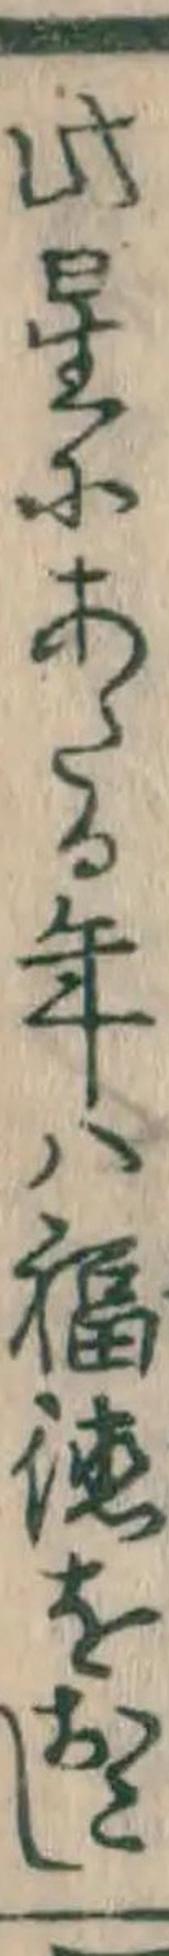此星にあたる年は福徳をおこし
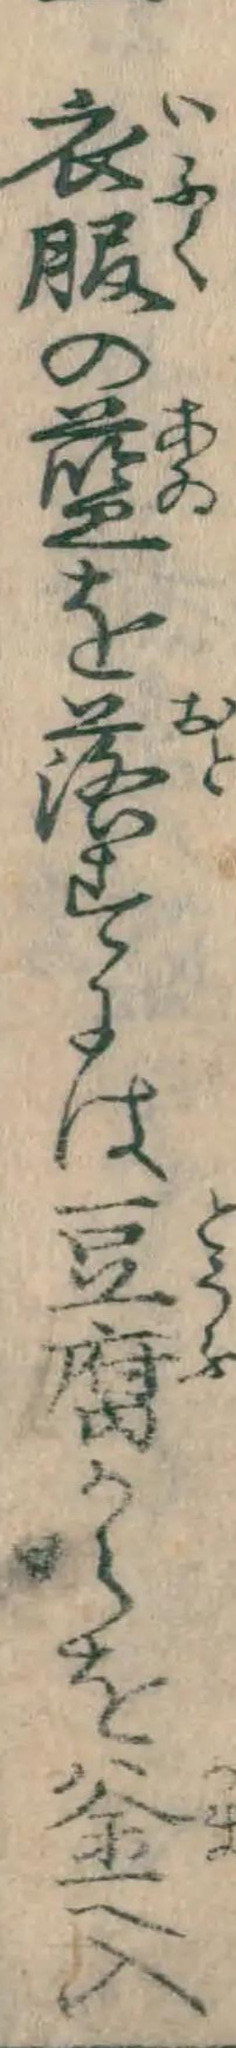一衣服の藍を落すには豆腐からを釜へ入

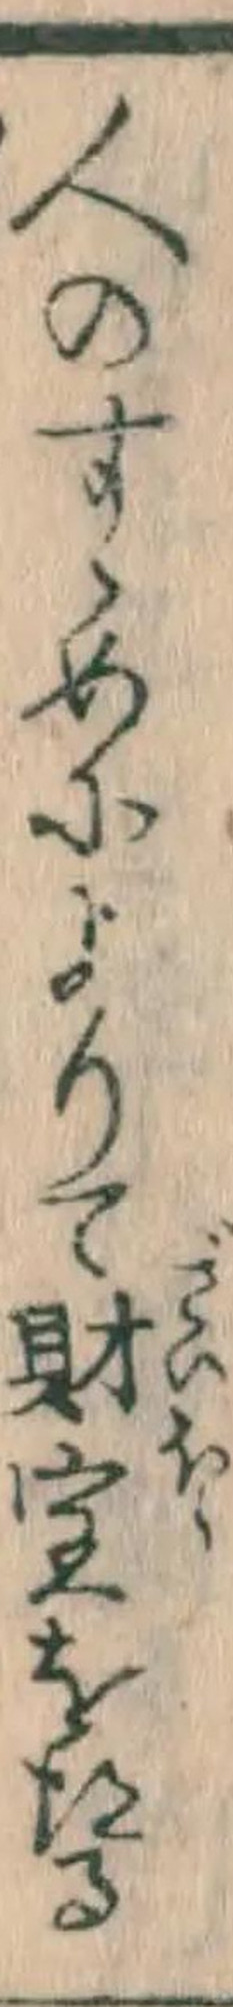人のすゝめによりて財宝を得る
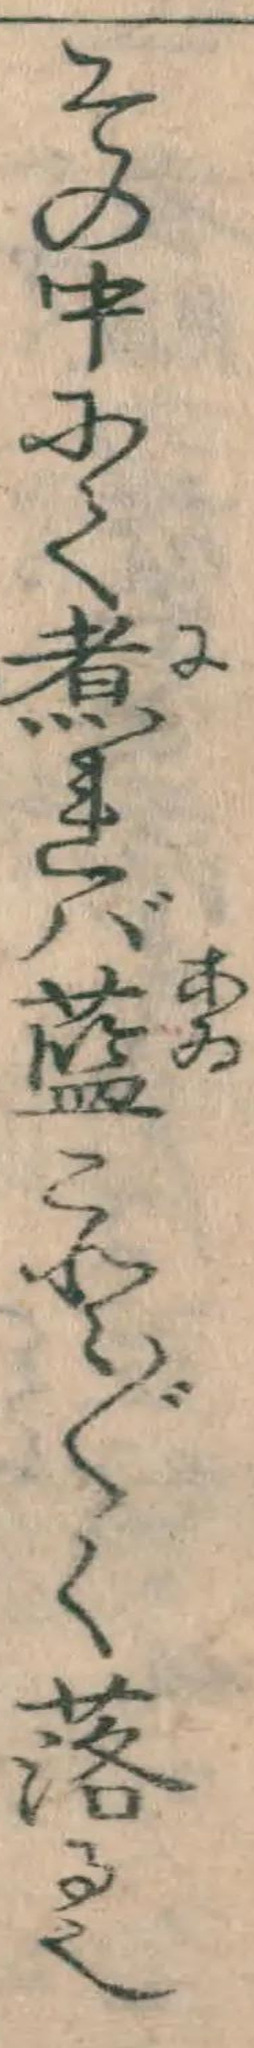その中にて煮れば藍こと〴〵く落る也
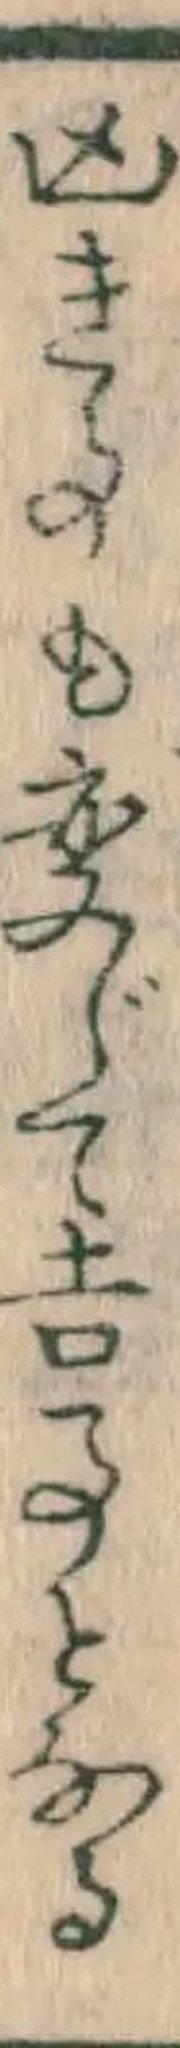凶き事も変じて吉事となる
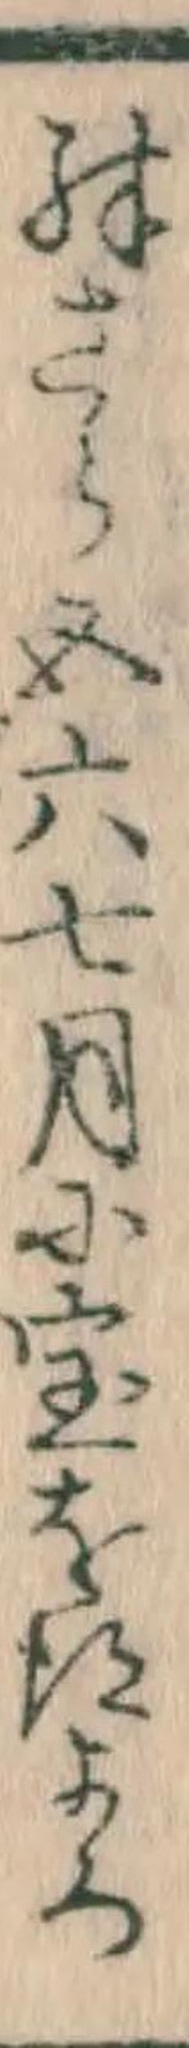殊さら五六七月に宝を得よろ
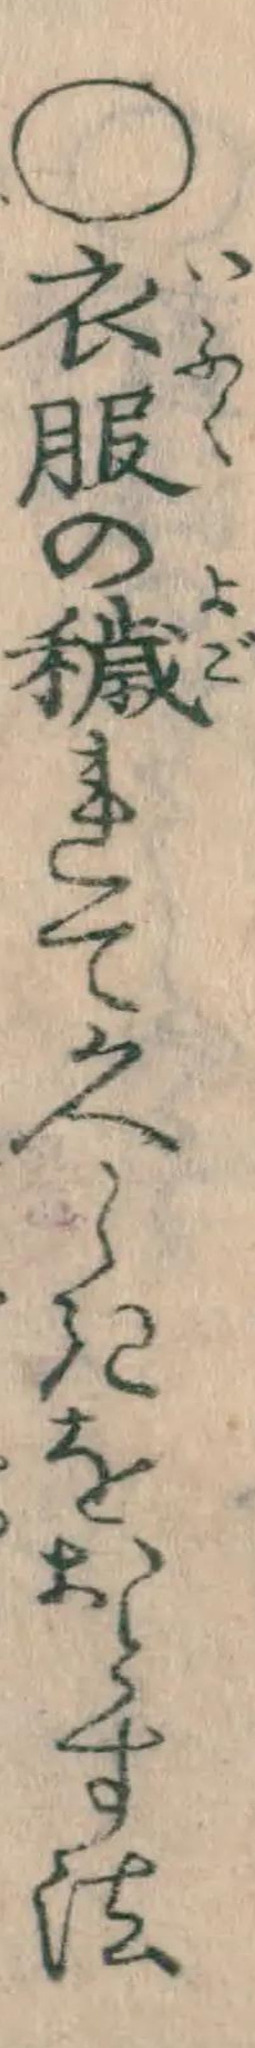○衣服の穢れて久しきをおとす法
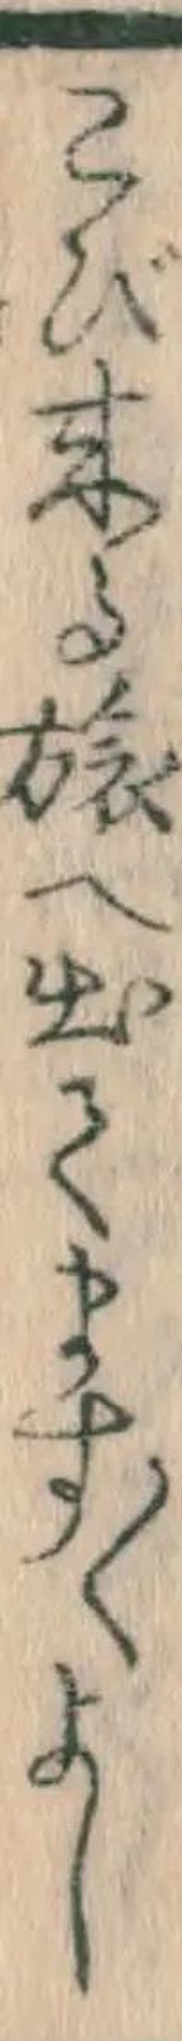こび来る旅へ出てます〳〵よし
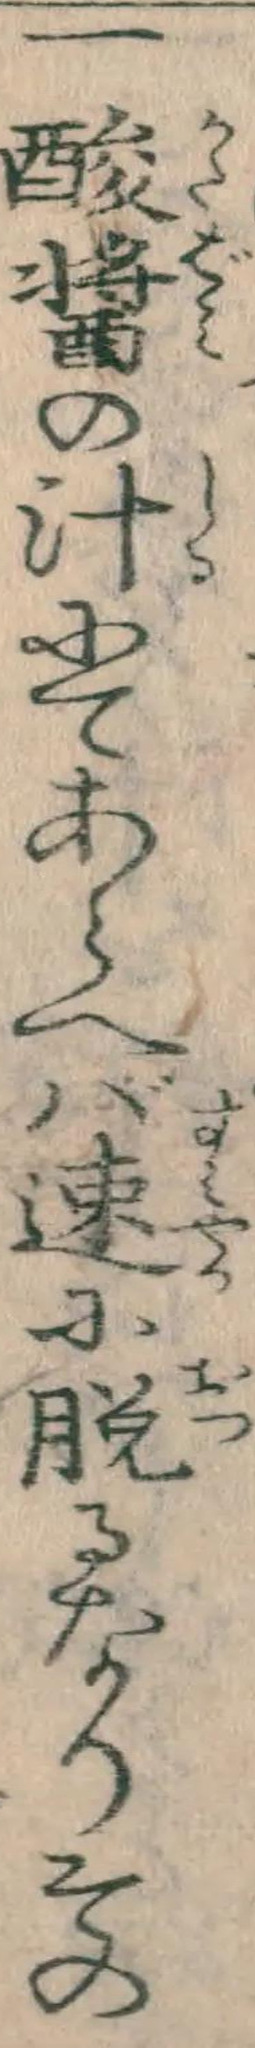一酸醬の汁にてあらへば速に脱るなりその
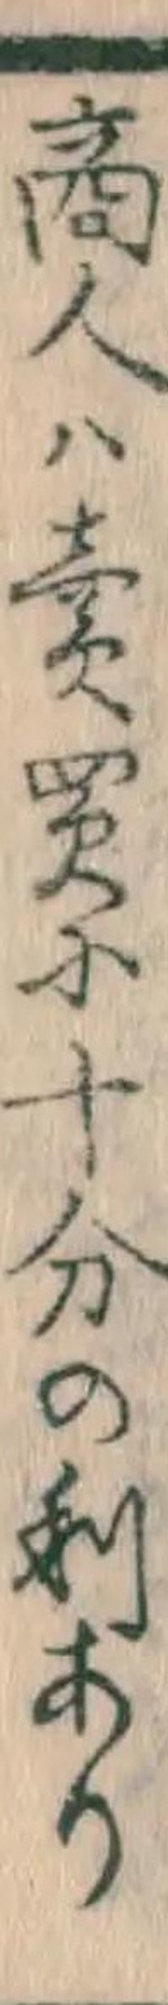商人は売買に十分の利あり
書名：広益秘事大全 3巻. [1]
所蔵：国立国会図書館 National Diet Library, JAPAN
